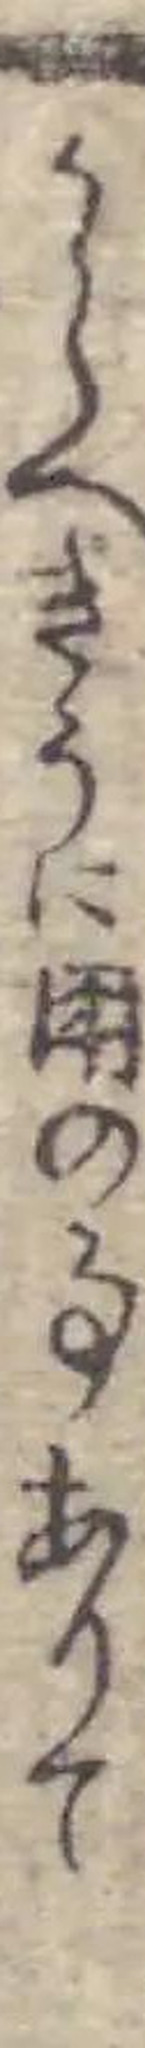うらへきうに用の事ありて
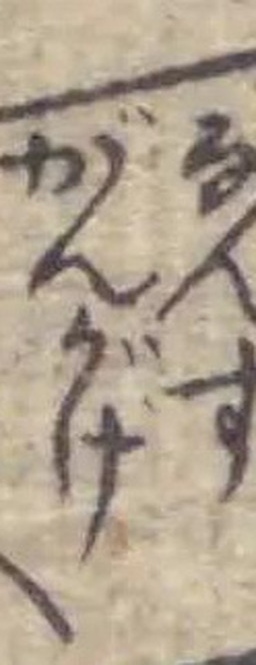かんがけ
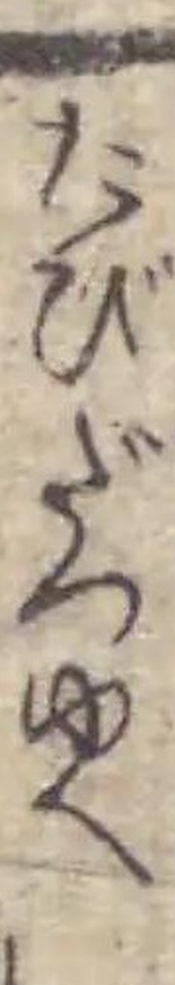たびだつゆへ
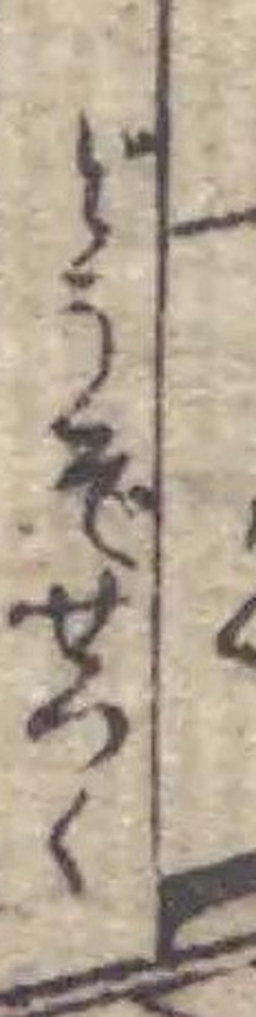どうぞせつく
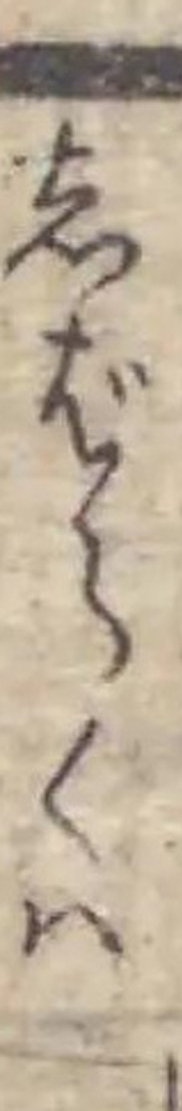しばらくは
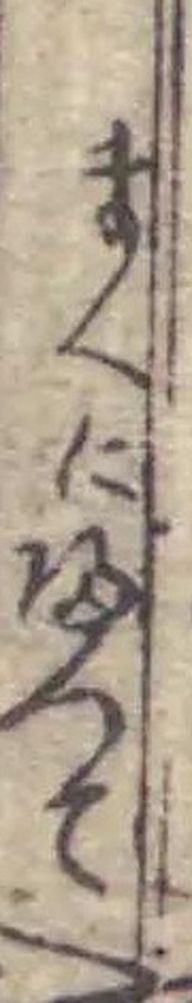まへに帰つて
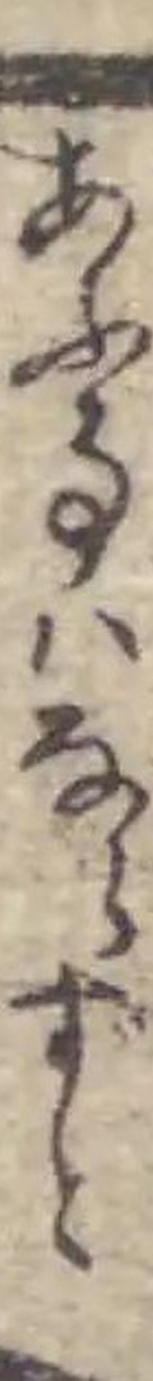あふ事はならずと
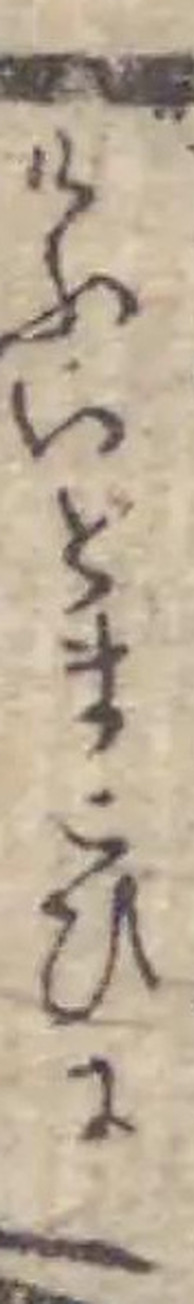けふいとまこひに
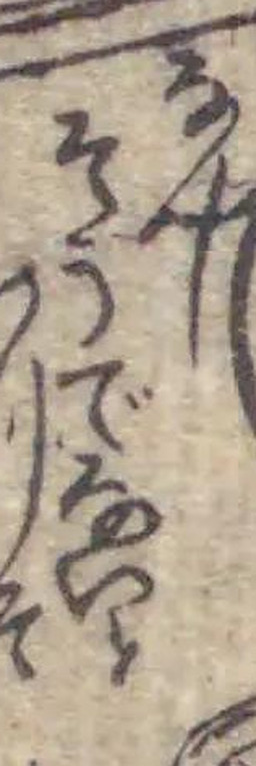そうでないと
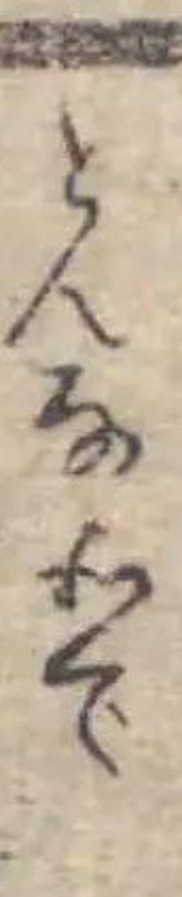とんな所で
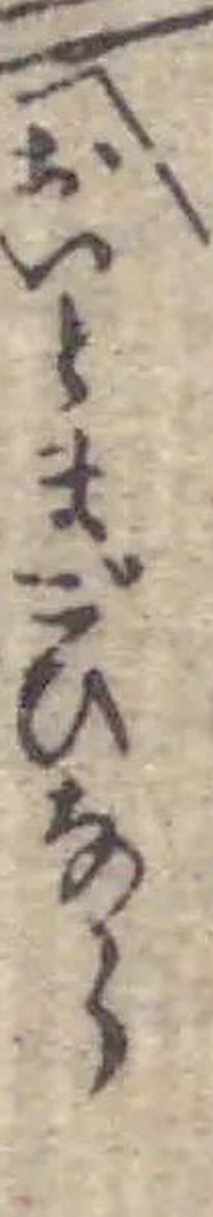〽おいとまごひなら
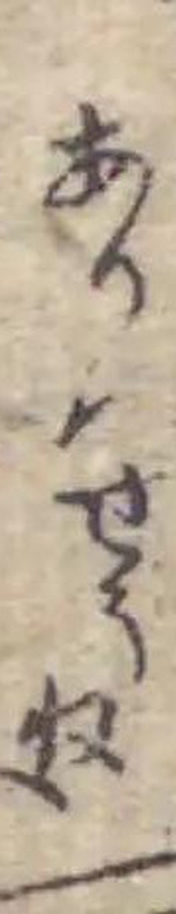ありんせうねへ
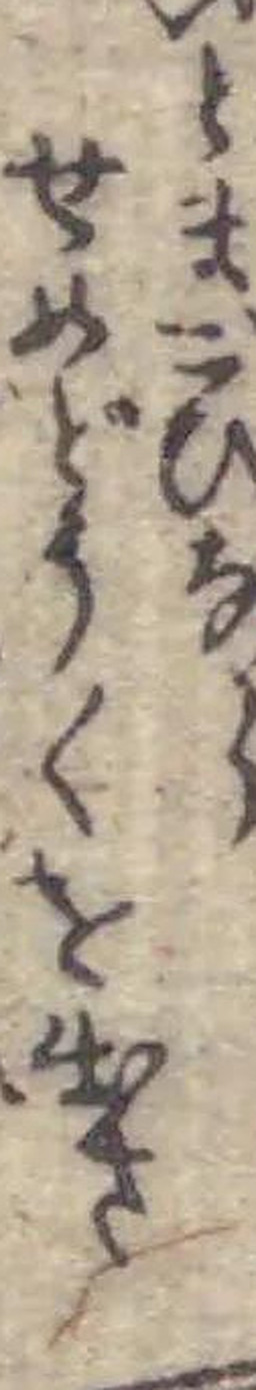せめどうくを出さ
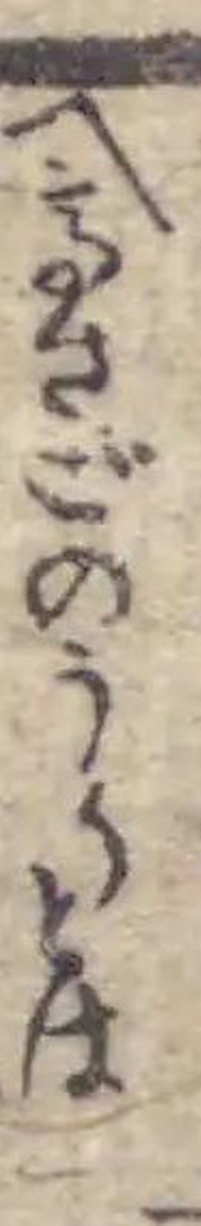〽高さごのうらは
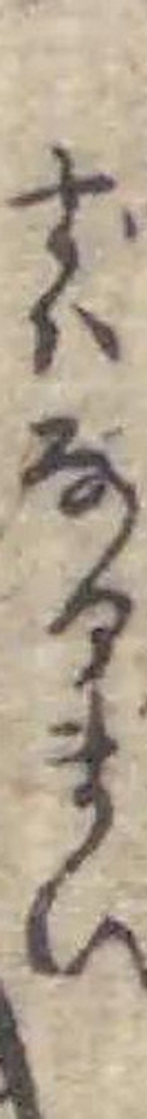ずはなるまい
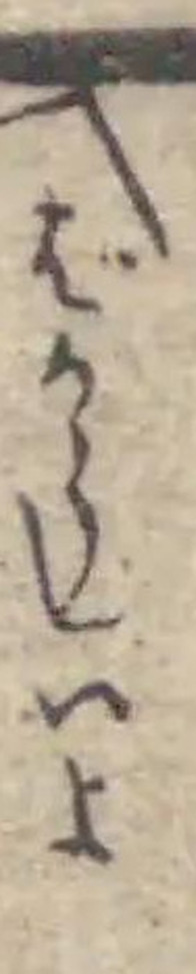〽ばからしいよ
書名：見立蓬莱 : 2巻
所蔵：国立国会図書館 National Diet Library, JAPAN
